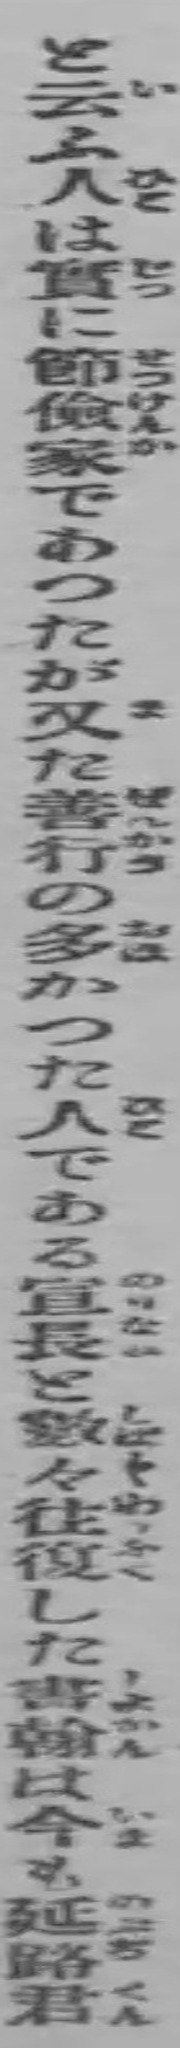と云ふ人は実に節倹家であつたが又た善行の多かつた人である宣長と数々往復した書翰は今も延路君
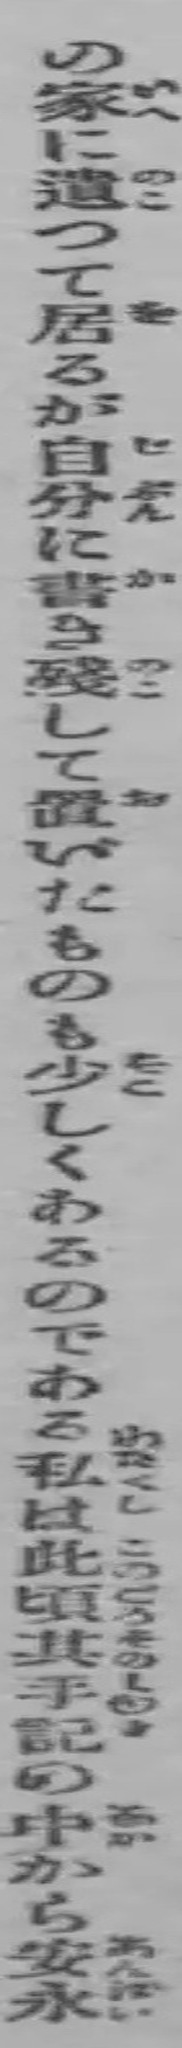の家に遺つて居るが自分に書き残して置いたものも少しくあるのである私は此頃其手記の中から安永
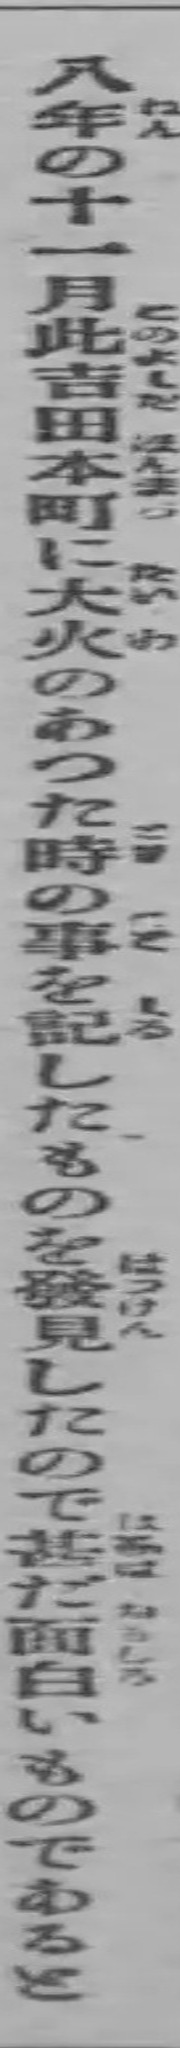八年の十一月此吉田本町に大火のあつた時の事を記したものを発見したので甚だ面白いものであると
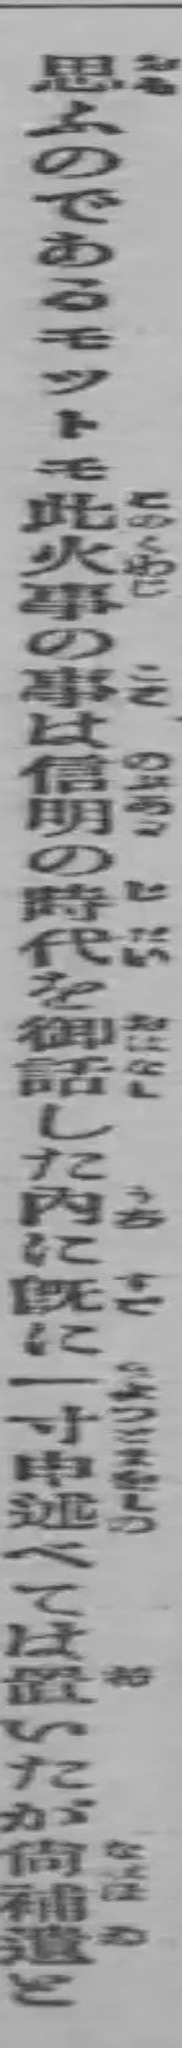思ふのであるモツトモ此火事の事は信明の時代を御話した内に既に一寸申述べては置いたが尚補遺と
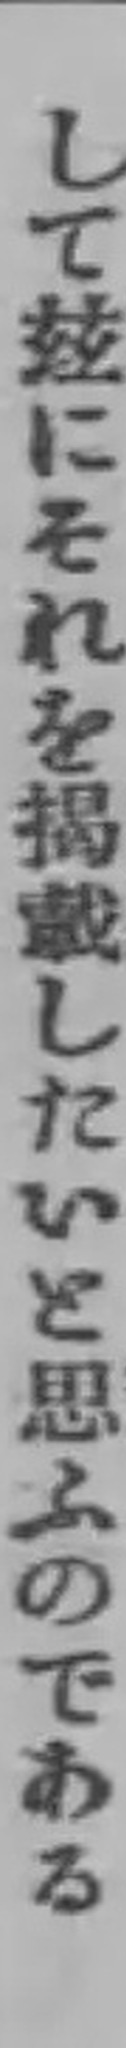して茲にそれを掲載したいと思ふのである

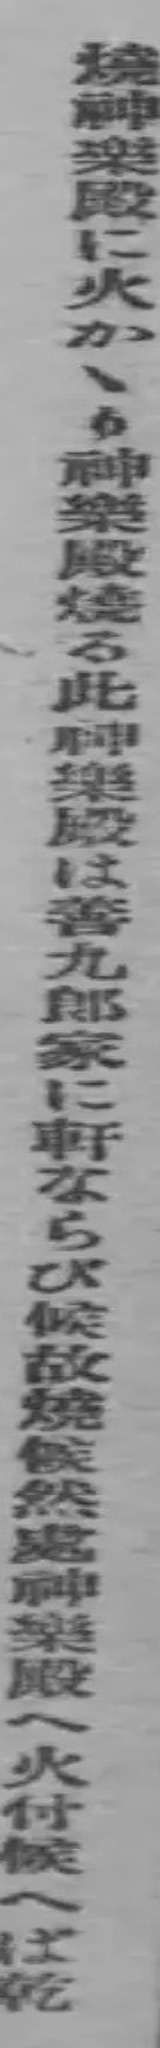焼神楽殿に火かゝり神楽殿焼る此神楽殿は善九郎家に軒ならび候故焼候然処神楽殿へ火付候へば乾
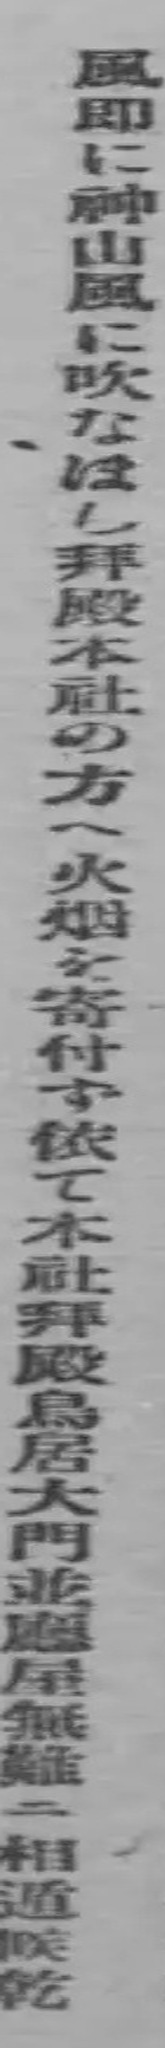風即に神山風に吹なほし拝殿本社の方へ火烟を寄付ず依て本社拝殿鳥居大門並応屋無難ニ相遁候乾
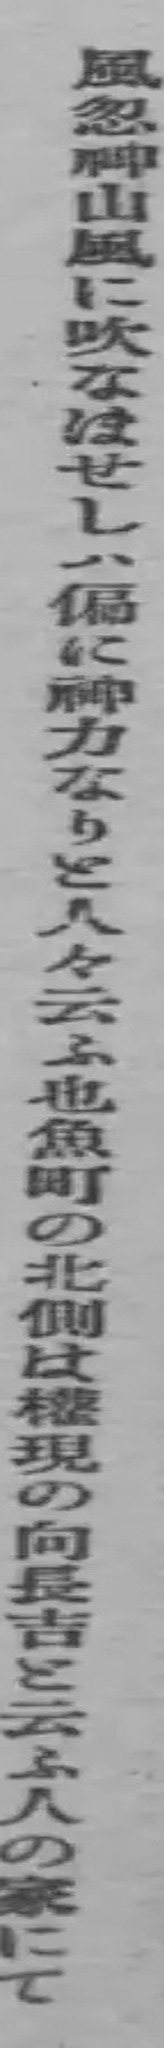風忽神山風に吹なほせしハ偏に神力なりと人々云ふ也魚町の北側は権現の向長吉と云ふ人の家にて
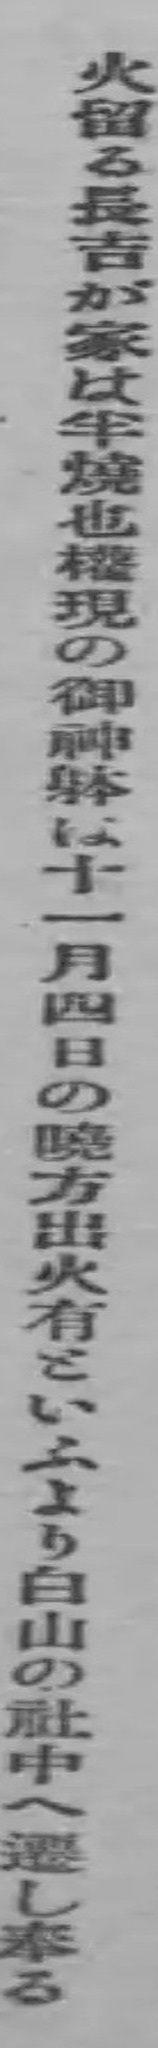火留る長吉が家は半焼也権現の御神躰は十一月四日の暁方出火有といふより白山の社中へ遷し奉る
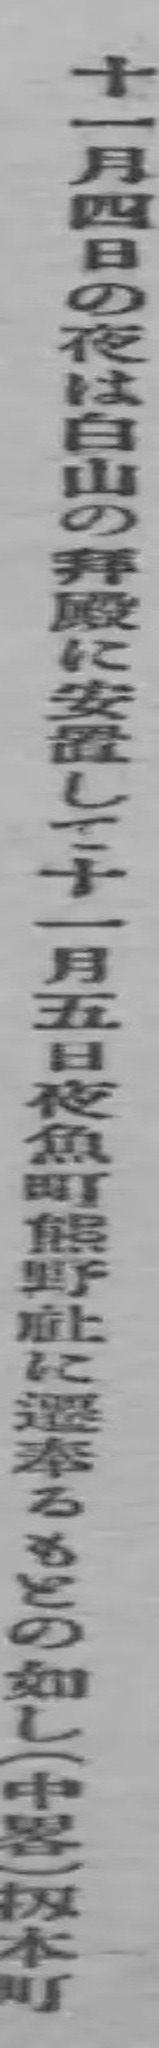十一月四日の夜は白山の拝殿に安置して十一月五日夜魚町熊野社に遷奉るもとの如し(中略)扨本町
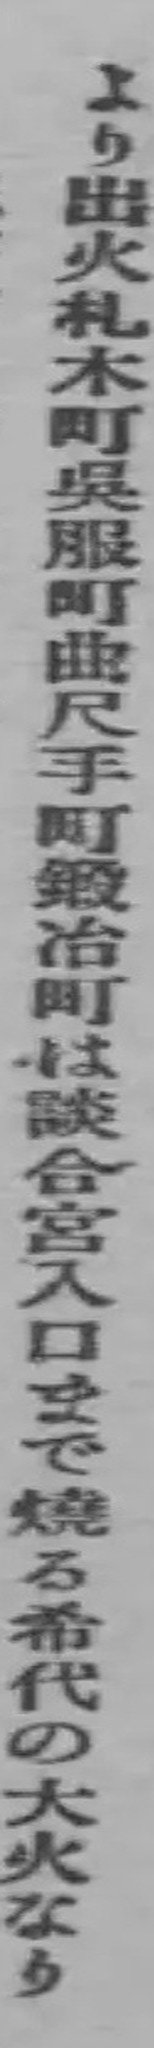より出火札木町呉服町曲尺手町鍛冶町は談合宮入口まで焼る希代の大火なり
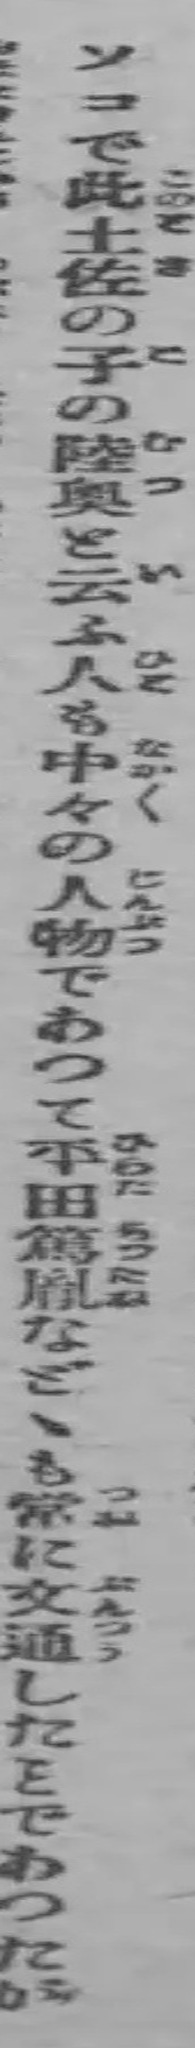ソコで此土佐の子の陸奥と云ふ人も中々の人物であつて平田篤胤などゝも常に文通したことであつたが
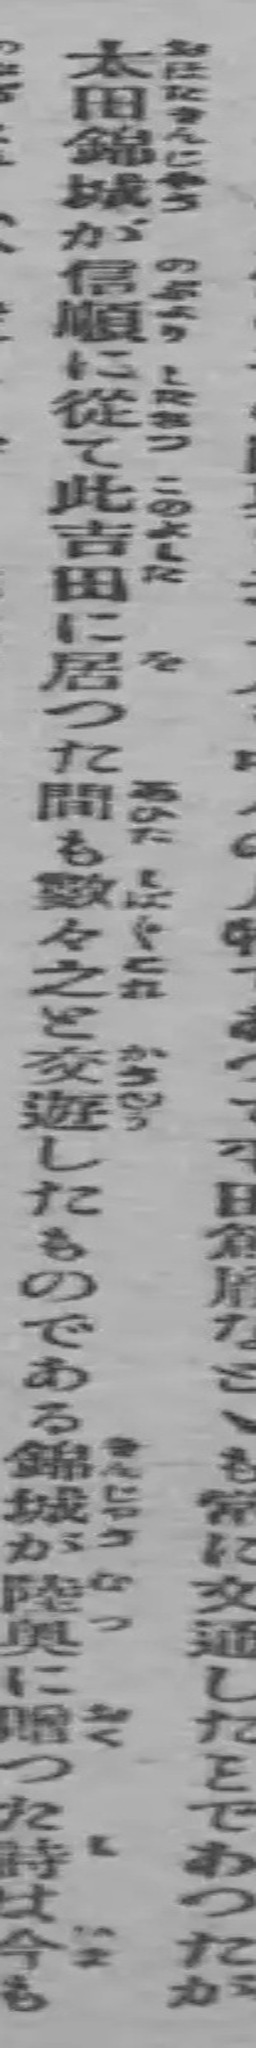太田錦城が信順に従て此吉田に居つた間も数々之と交遊したものである錦城が陸奥に贈つた詩は今も
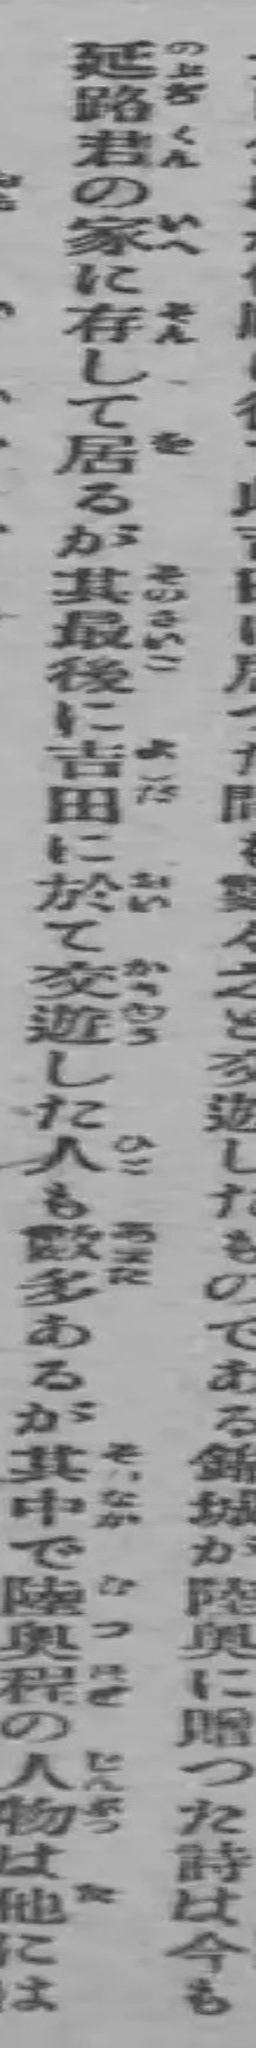延路君の家に存して居るが其最後に吉田に於て交遊した人も数多あるが其中で陸奥程の人物は他には
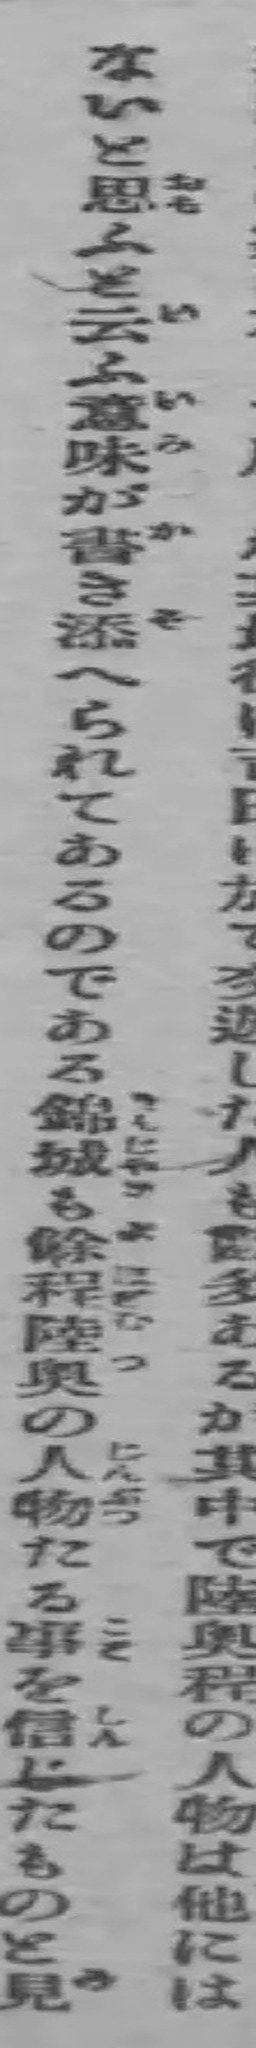ないと思ふと云ふ意味が書き添へられてあるのである錦城も余程陸奥の人物たる事を信じたものと見
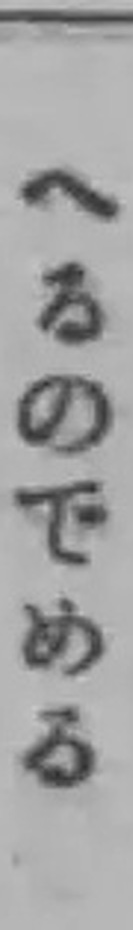へるのでめる
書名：豊橋市史談
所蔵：国立国会図書館 National Diet Library, JAPAN
